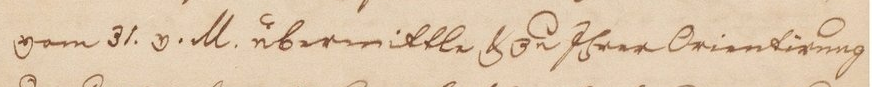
vom 31. v. M. übermittle & zu Ihrer Orientirung
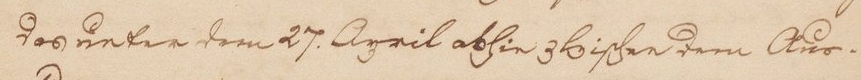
das unter dem 27. April abhin zwischen dem Aus-
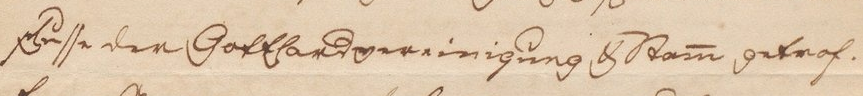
schusse der Gotthardvereinigung & Stamm getrof-
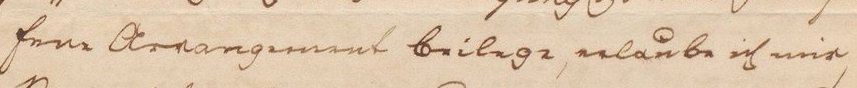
fene Arrangement beilege, erlaube ich mir,
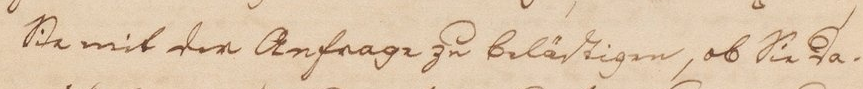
Sie mit der Anfrage zu belästigen, ob Sie da-
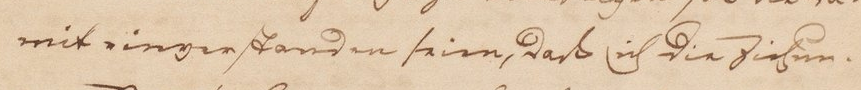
mit einverstanden seien, daß ich die Ziehun-
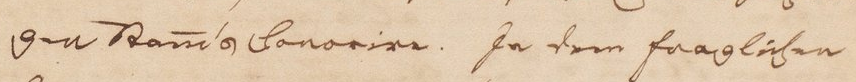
gen Stamm's honorire. In dem fraglichen
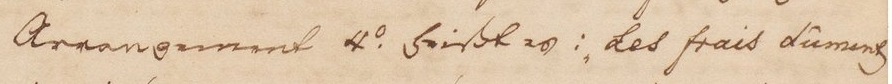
Arrangement 4o heißt es: «Les frais dûments
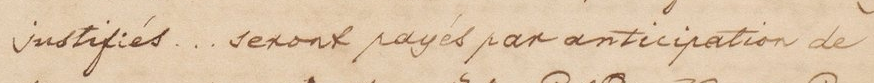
justifiés... seront payés par anticipation de
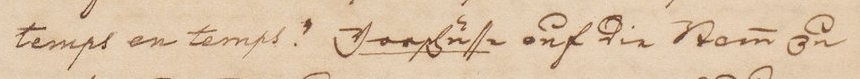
temps en temps.» Vorschüsse auf die Stamm zu
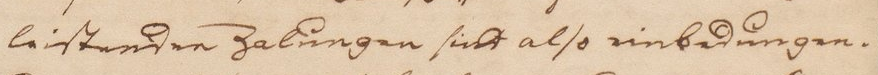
leistenden Zalungen sind also einbedungen.
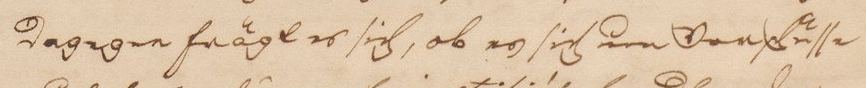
Dagegen frägt es sich, ob es sich um Vorschüsse
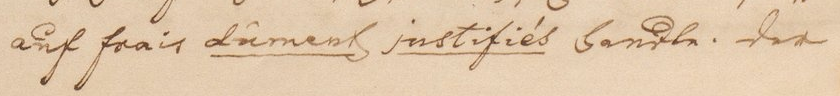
auf frais dûmentsjustifiés handle. Der
